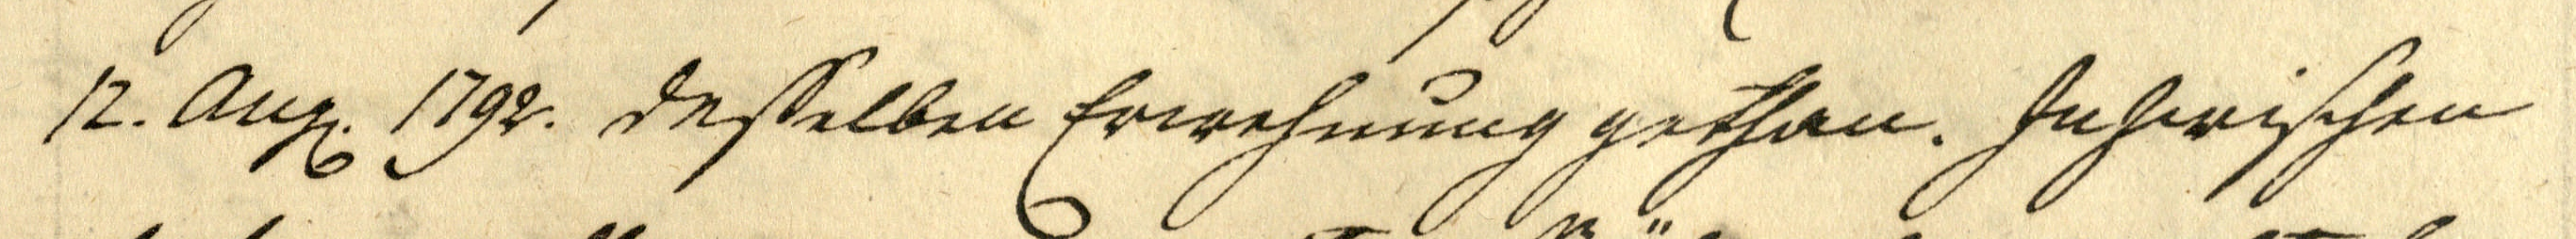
12. Aug. 1792. desselben Erwehnung gethan. Inzwischen
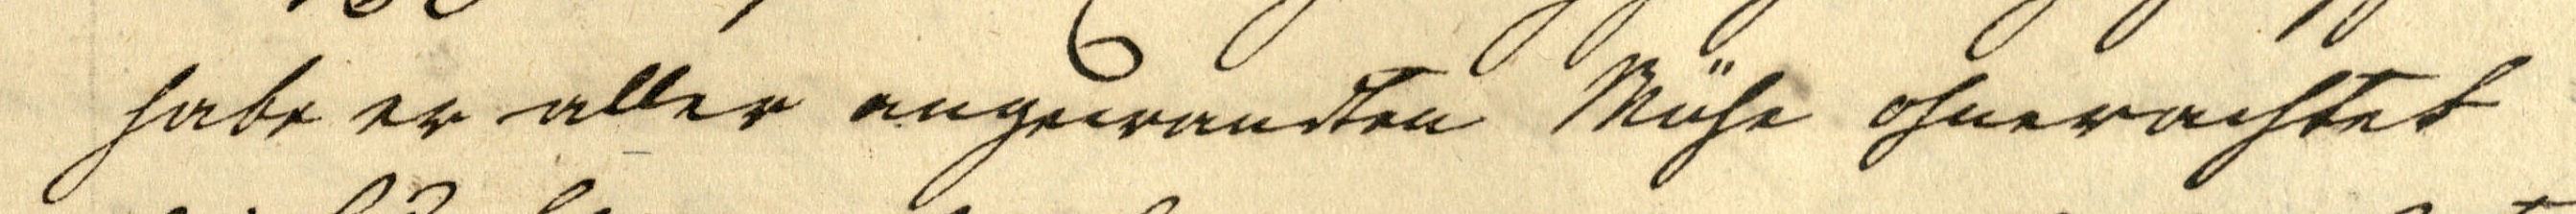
habe er aller angewandten Mühe ohnerachtet
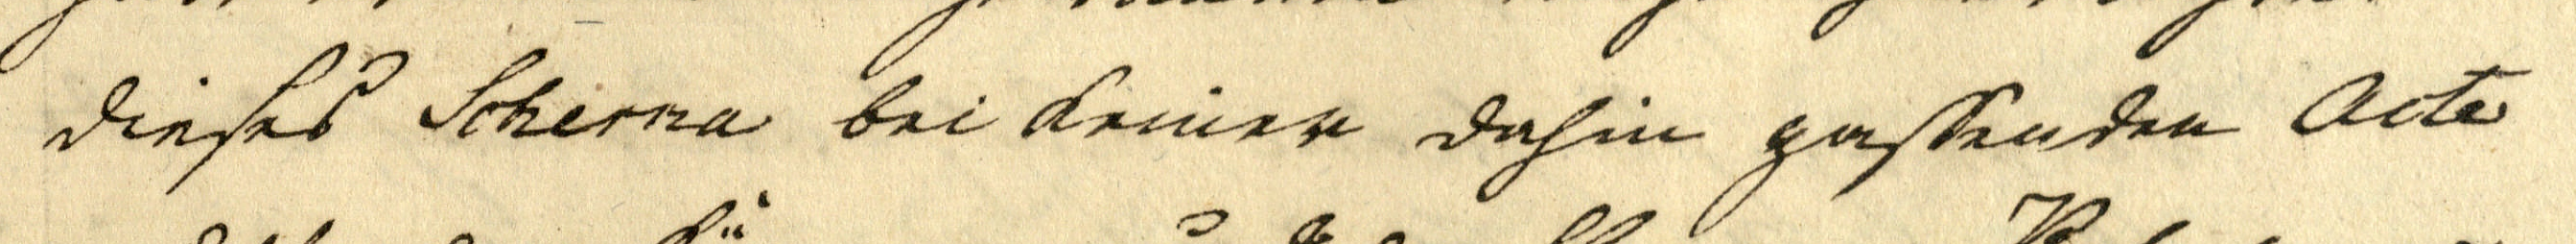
dieses Schema bei keiner dahin passenden Acte
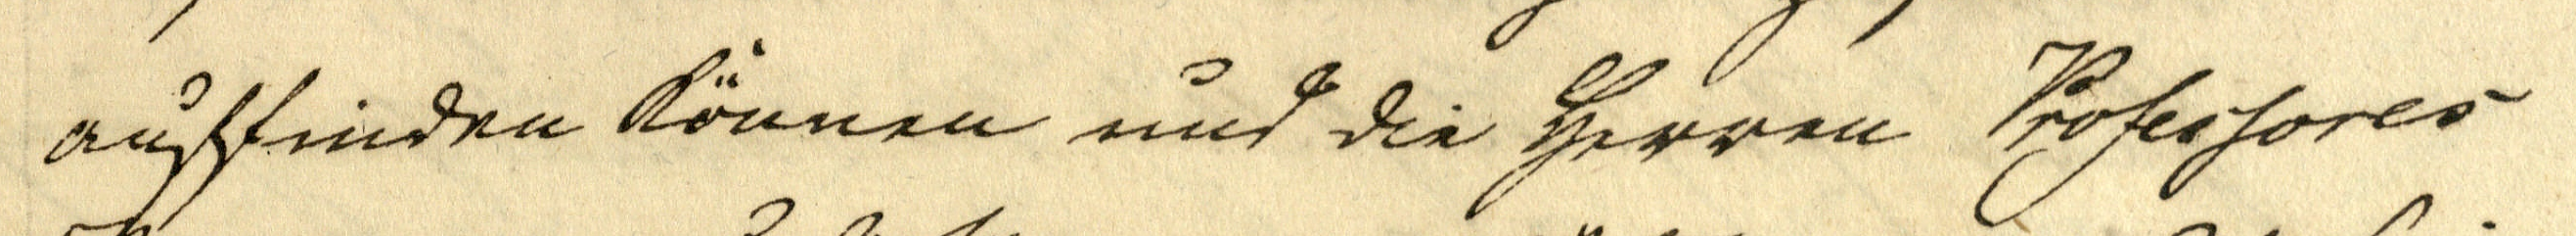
auffinden können und die Herren Professores
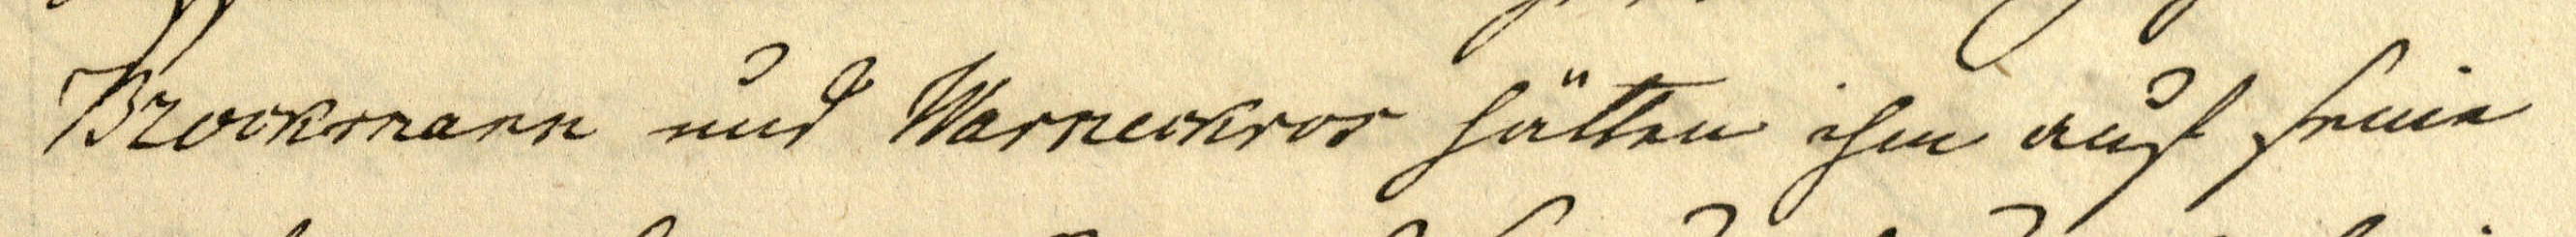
Brockmann und Warneckros hätten ihm auf seine
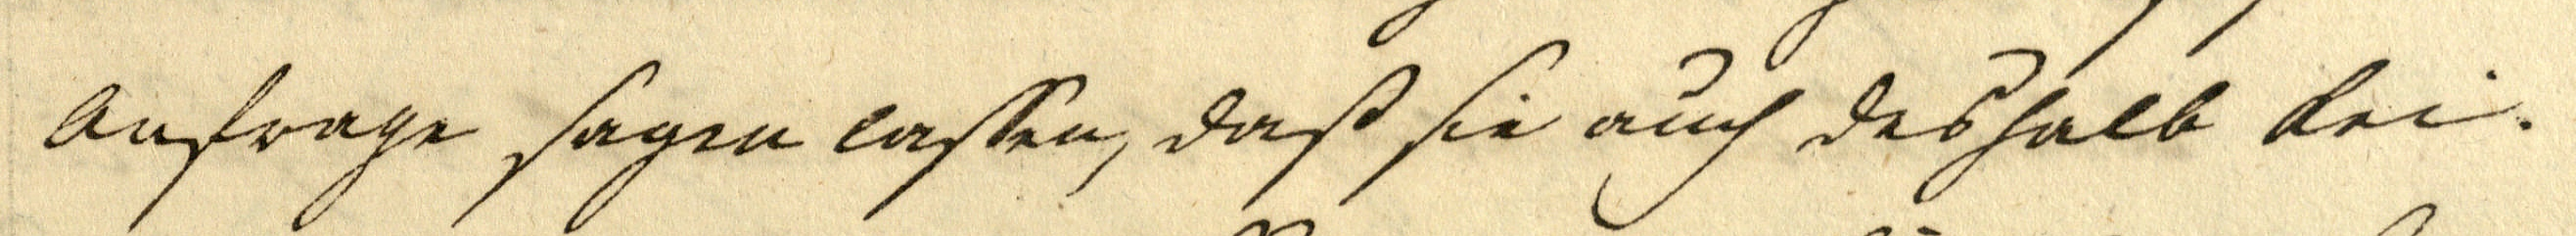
Anfrage sagen lassen, daß sie auch deshalb kei-
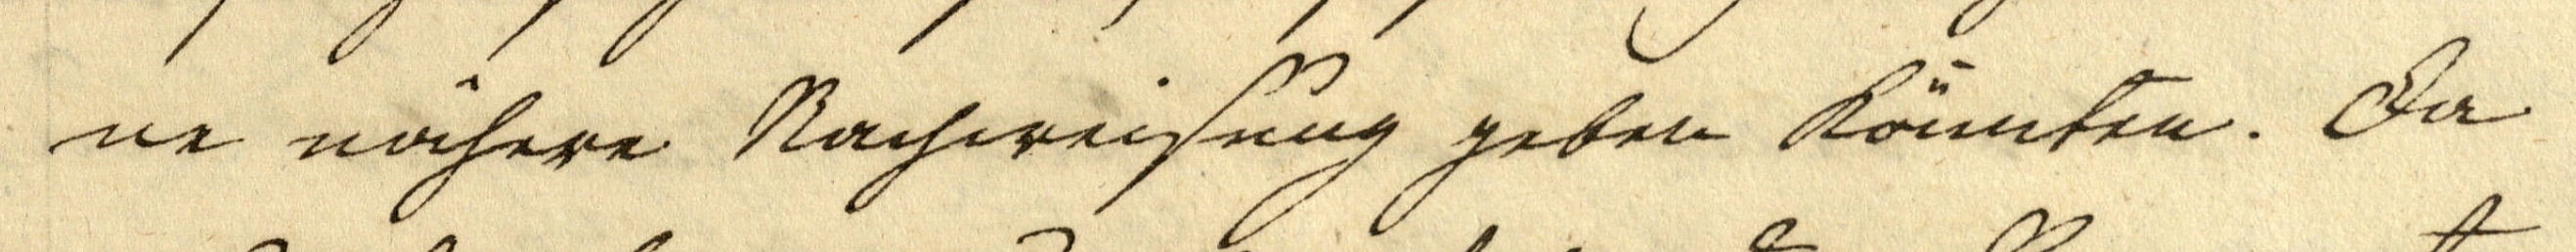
ne nähere Nachweisung geben könnten. Da
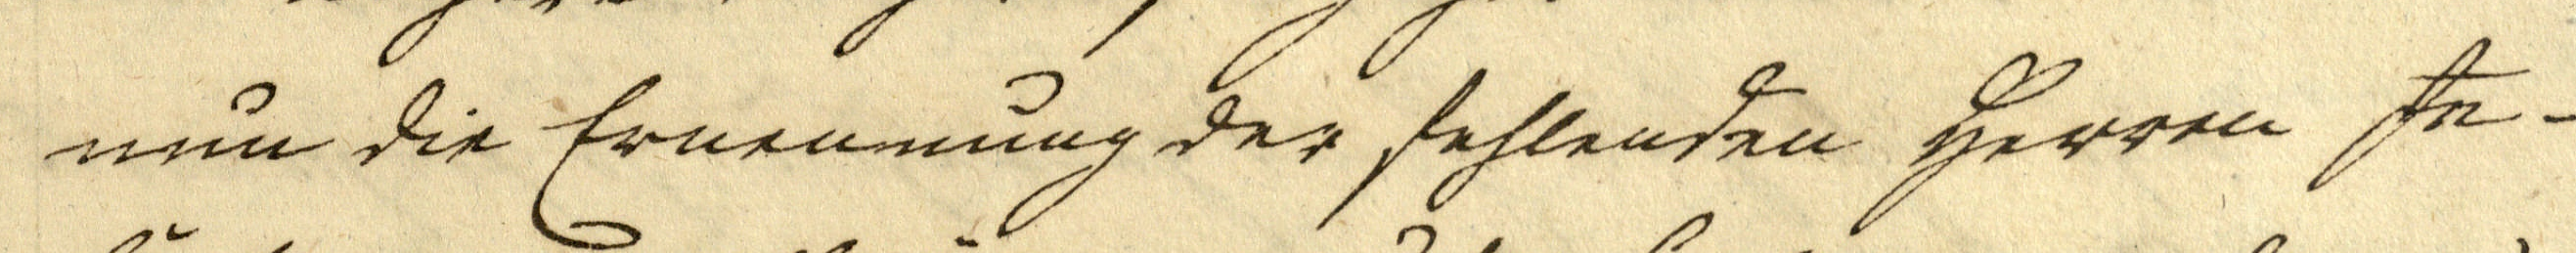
nun die Ernennung der fehlenden Herren In-
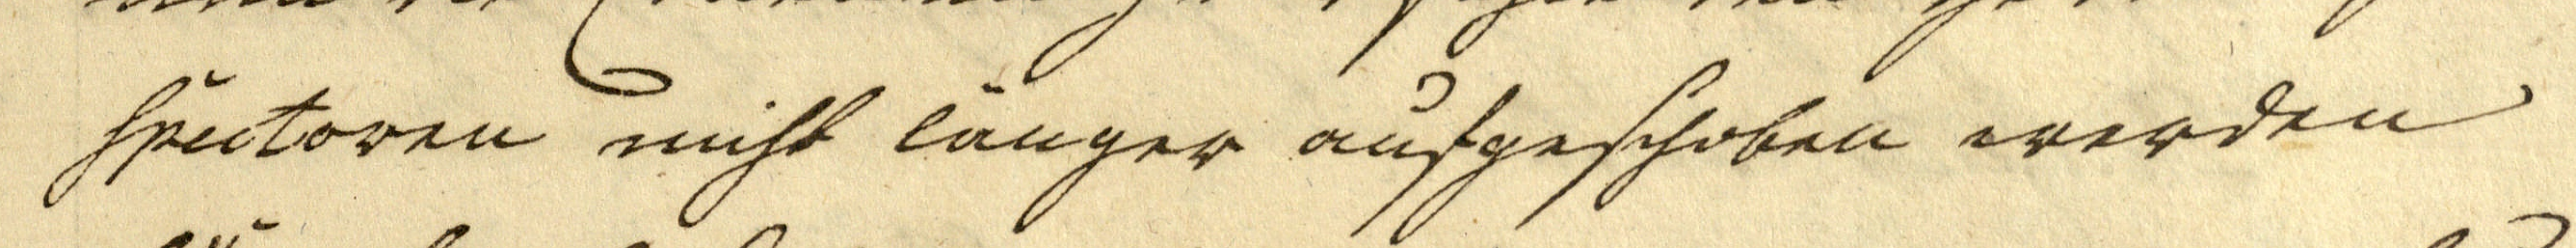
spectoren nicht länger aufgeschoben werden
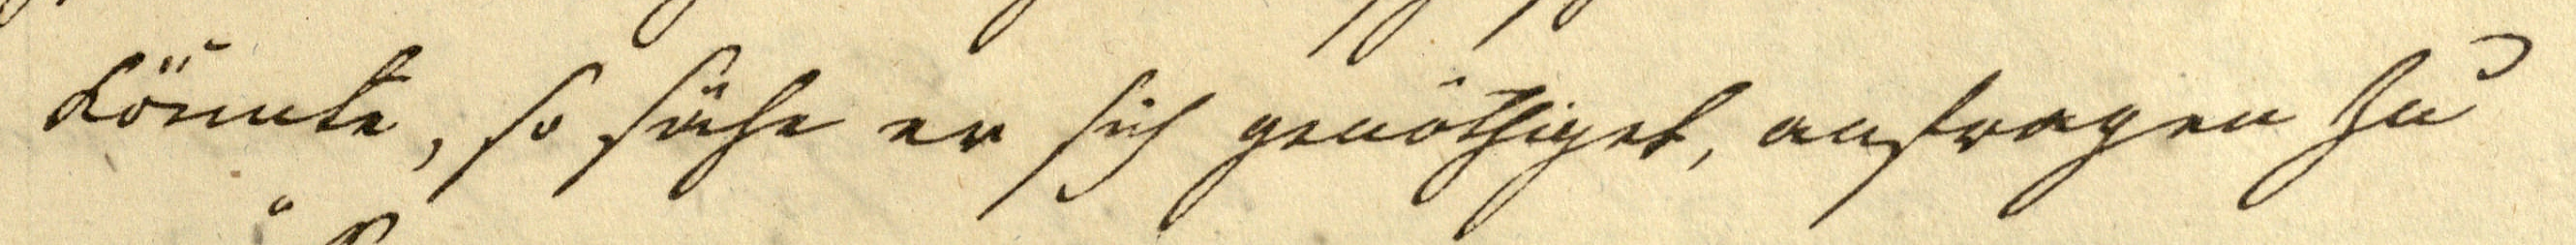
könnte, so sähe er sich genöthiget, anfragen zu
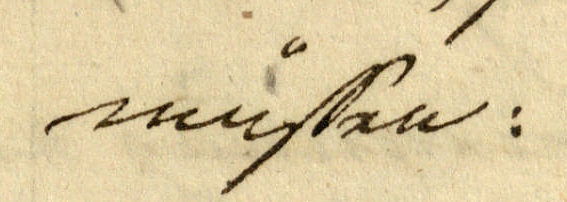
müssen:
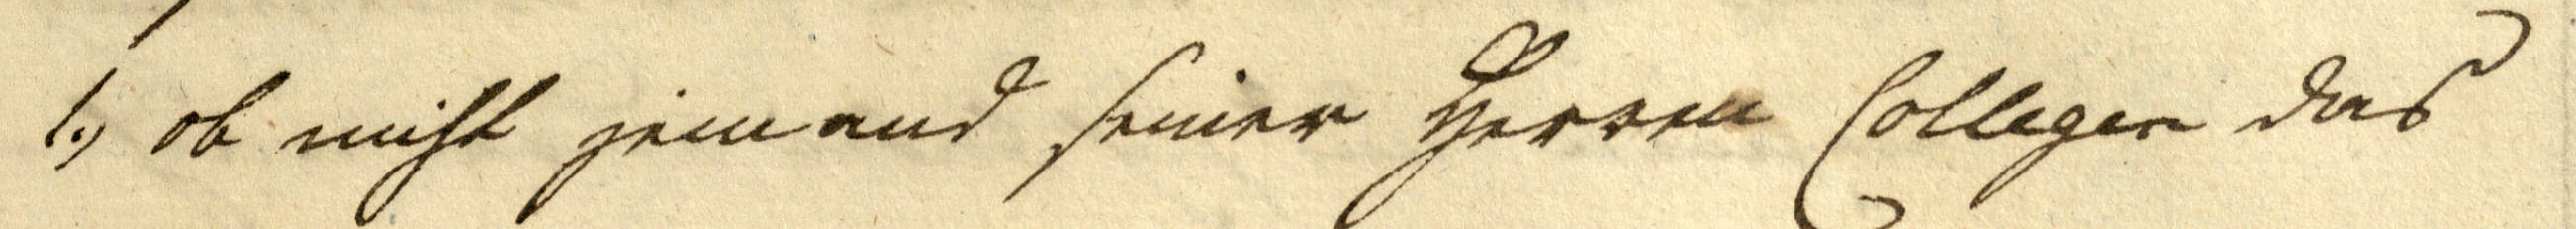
1., ob nicht jemand seiner Herren Collegen das
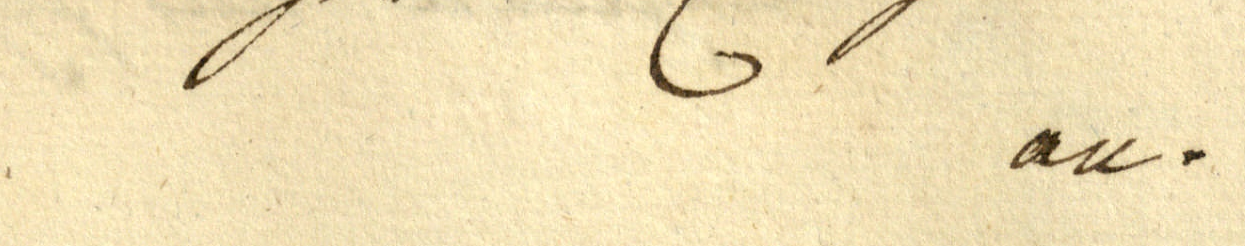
an-
